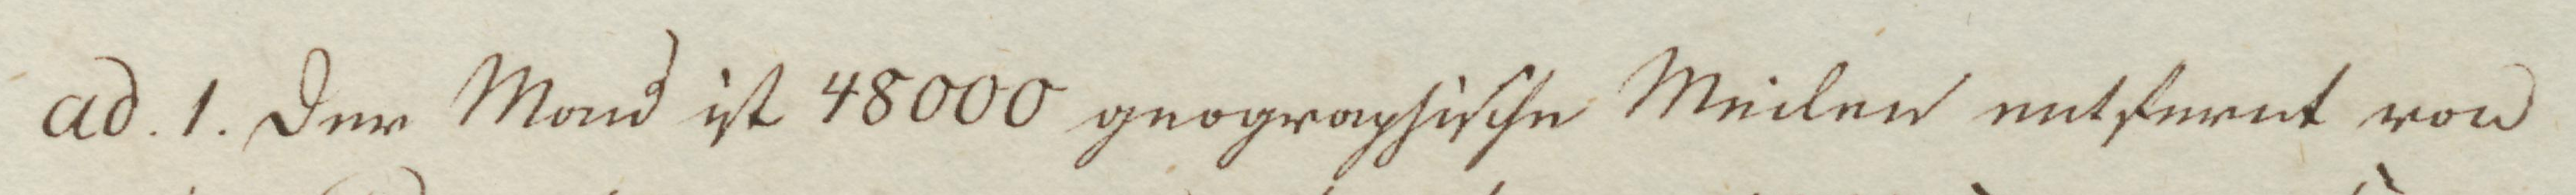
ad. 1. Der Mond ist 48000 geographische Meilen entfernt von
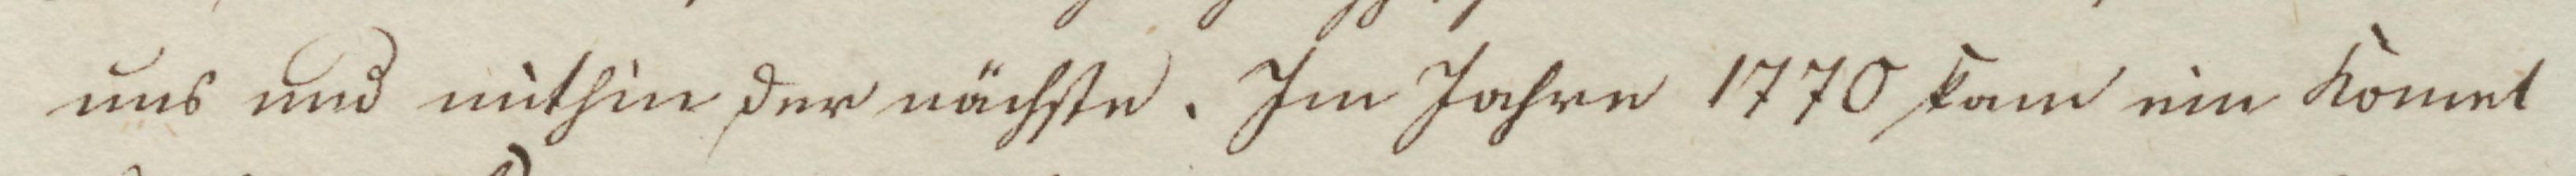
uns und mithin der nächste. Im Jahre 1770 kam ein Komet
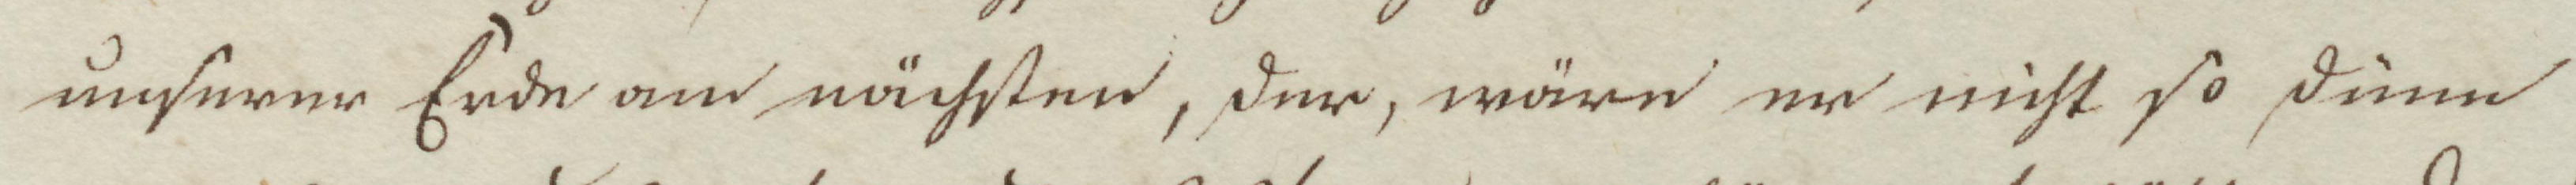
unserer Erde am nächsten, der, wäre er nicht so dünn
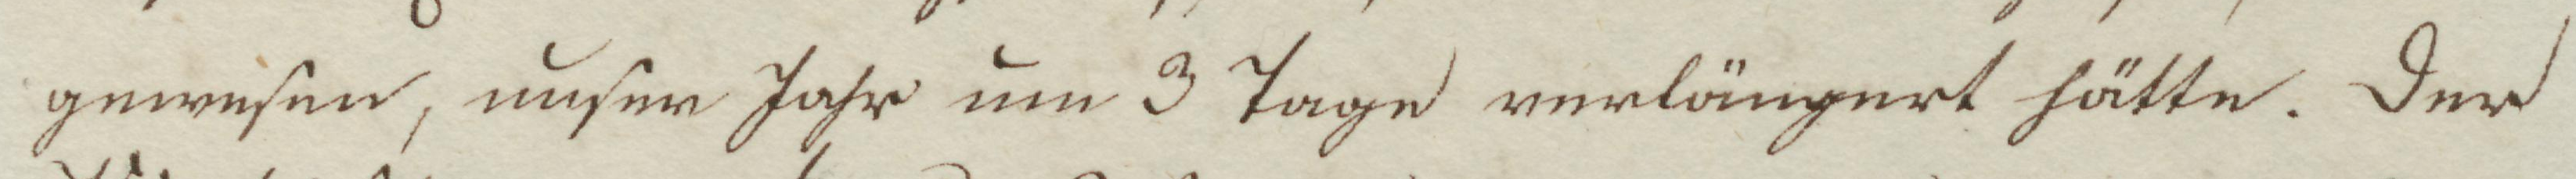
gewesen, unser Jahr um 3 Tage verlängert hätte. Der
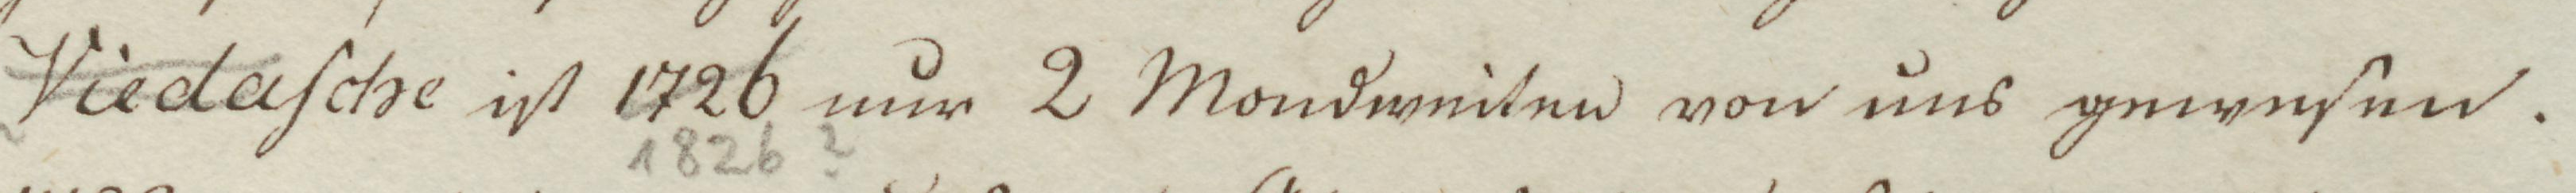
ViedaBielasche ist 17261826 ? nur 2 Mondweiten von uns gewesen.
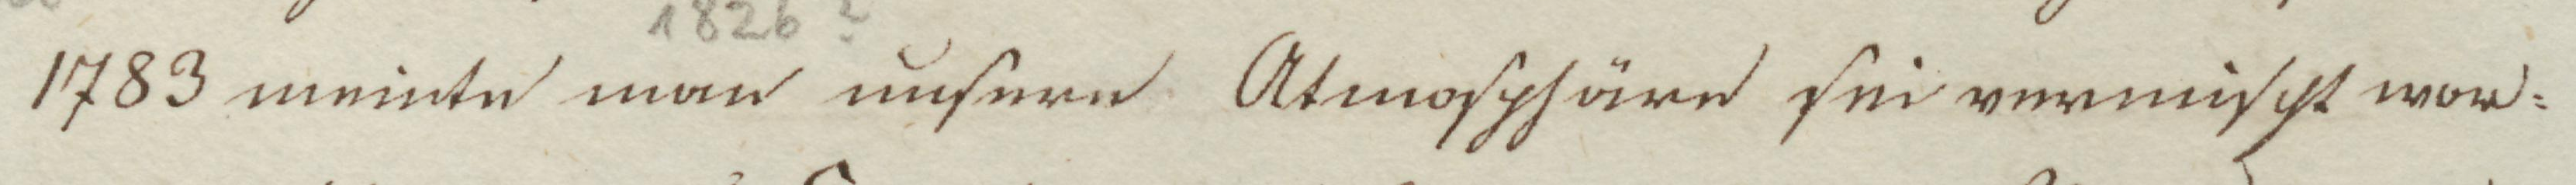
1783 meinte man unsere Atmosphäre sei vermischt wor-
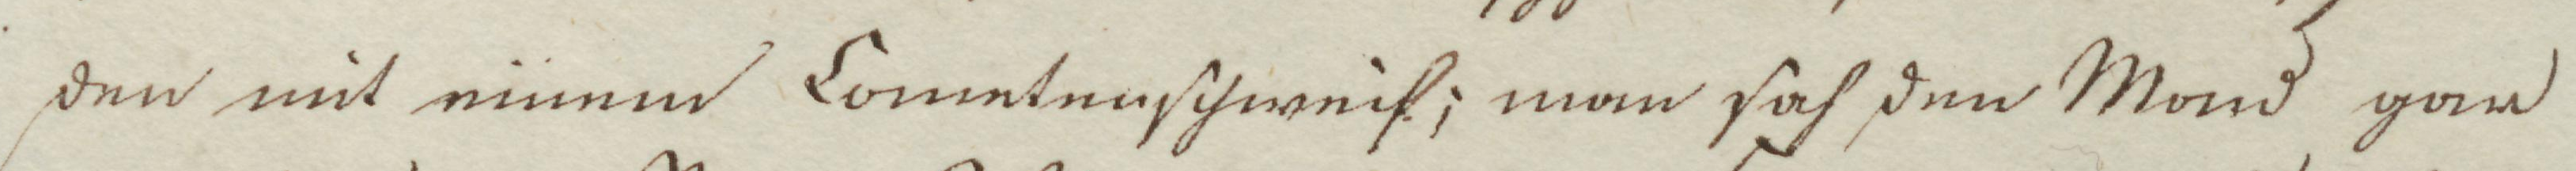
den mit einem Cometenschweif; man sah den Mond gar
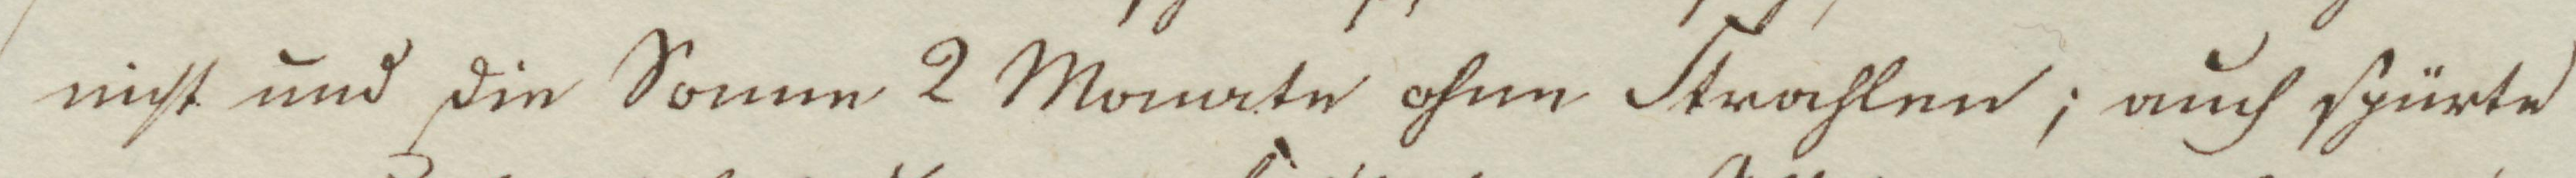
nicht und die Sonne 2 Monate ohne Strahlen; auch spürte
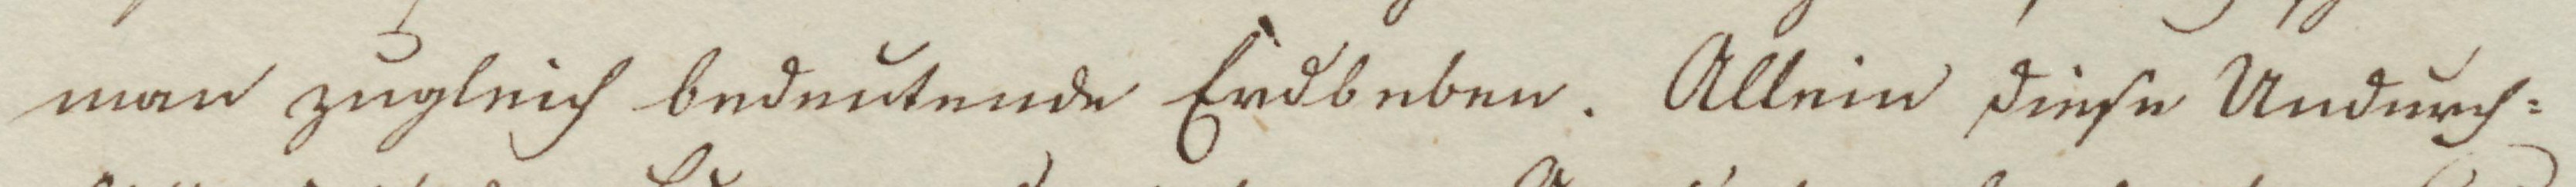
man zugleich bedeutende Erdbeben. Allein, diese Undurch-
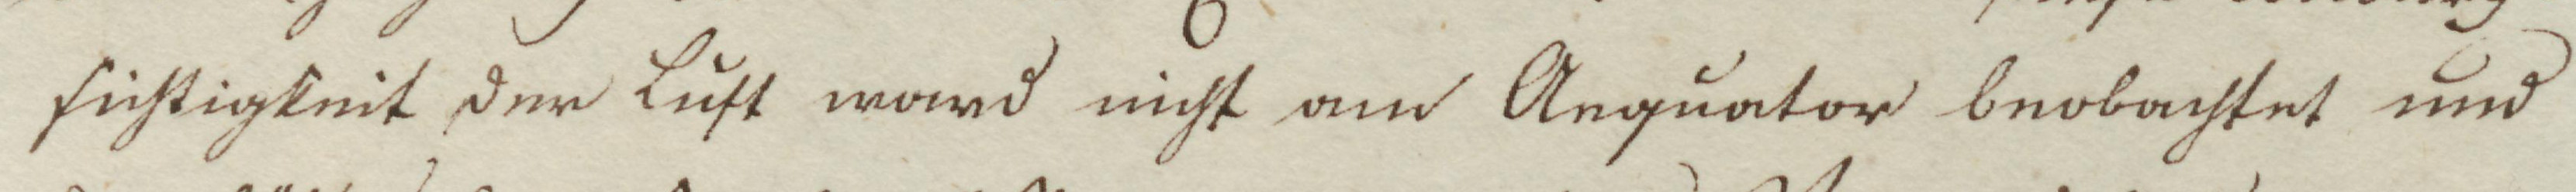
sichtigkeit der Luft ward nicht am Aequator beobachtet und
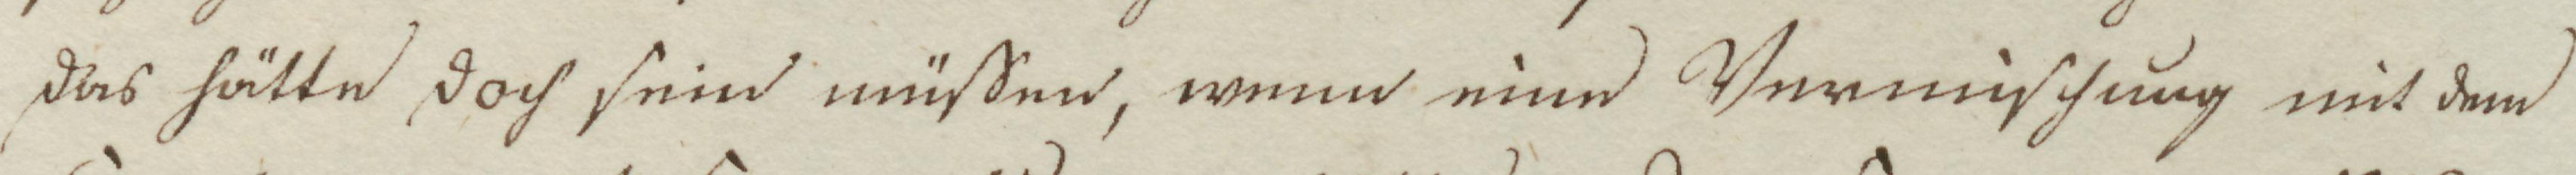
das hätte doch sein müssen, wenn eine Vermischung mit dem
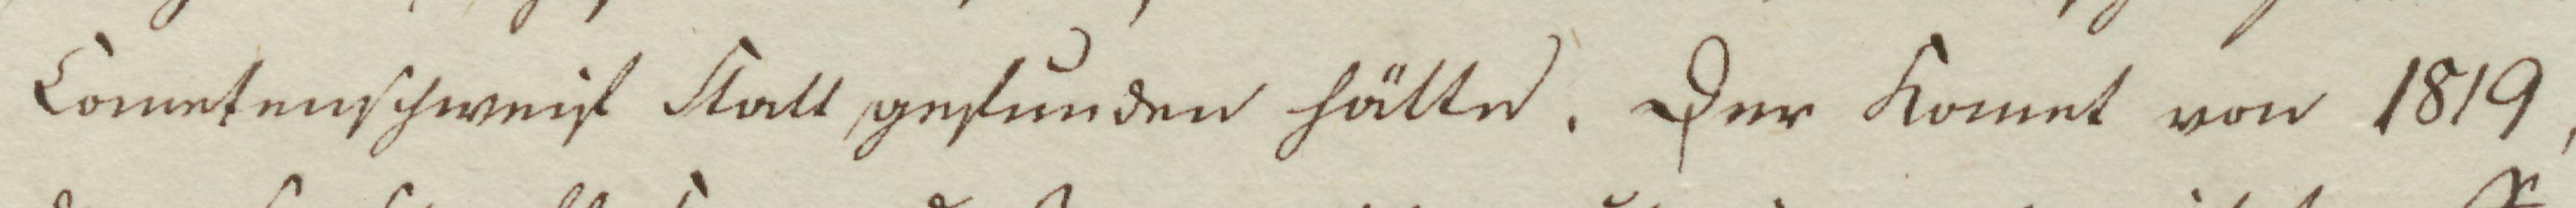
Cometenschweif Statt gefunden hätte. Der Komet von 1819,
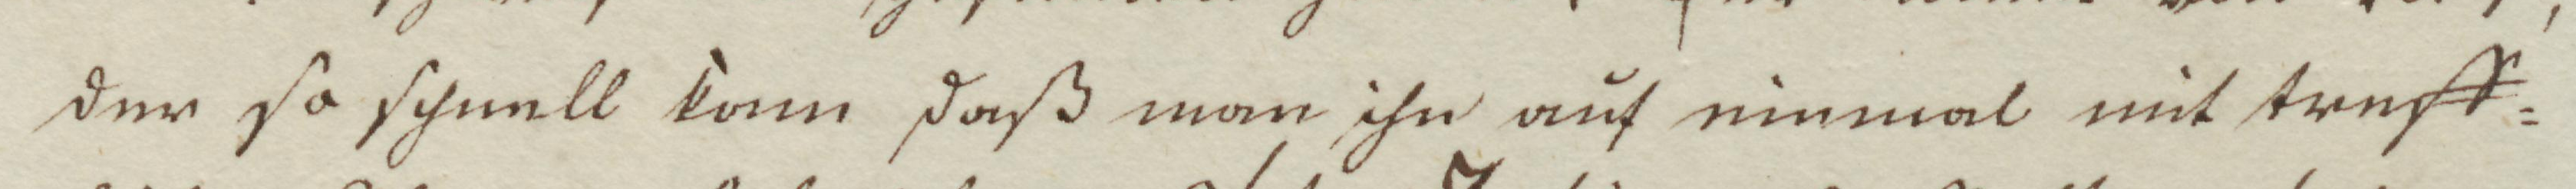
der so schnell kam daß man ihn auf einmal mit treff-
